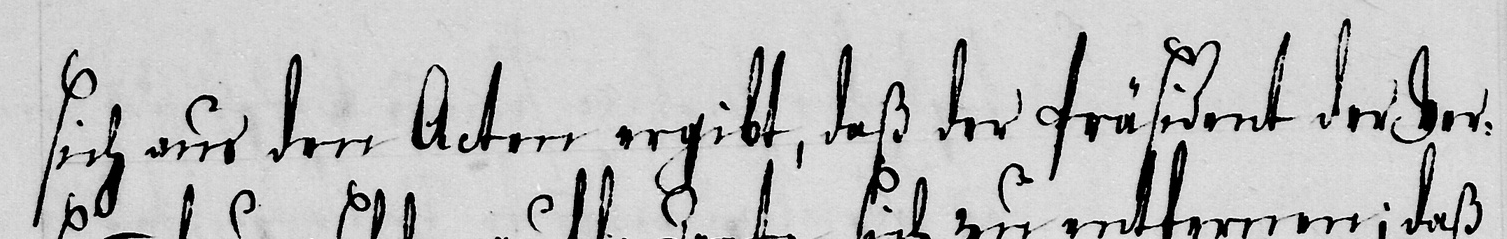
sich aus den Acten ergibt, daß der Präsident der Ver¬
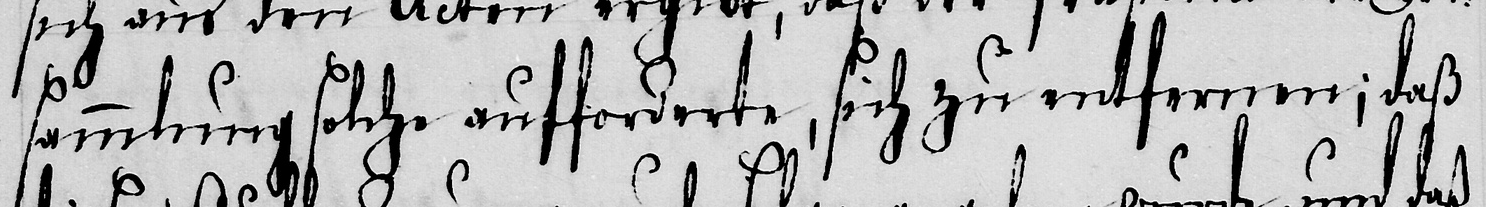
sammlung solche aufforderte, sich zu entfernen; daß
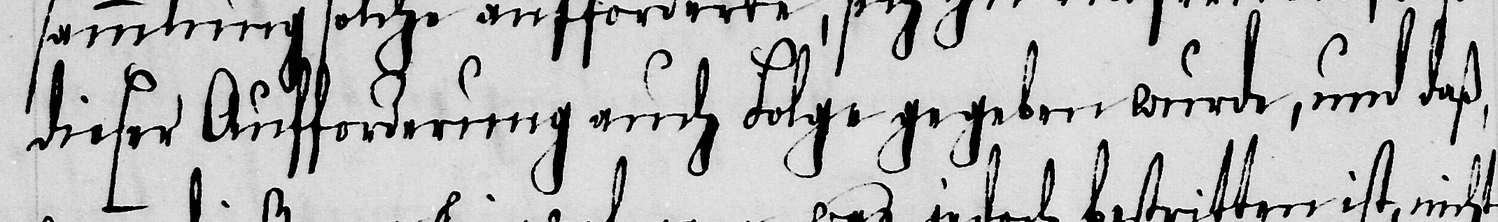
dieser Aufforderung auch Folge gegeben wurde, und daß,
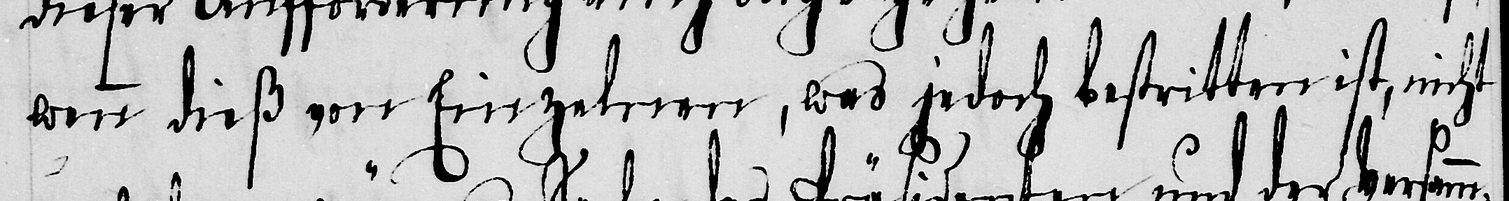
wenn dieß von Einzelnen, was jedoch bestritten ist, nicht
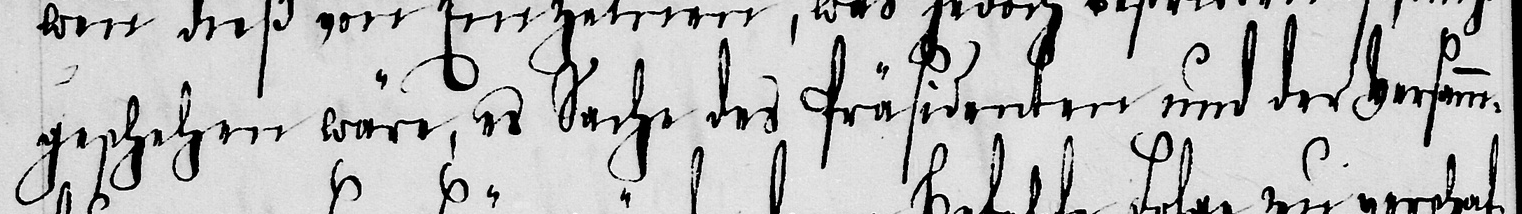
geschehen wäre, es Sache des Präsidenten und der Versamm¬
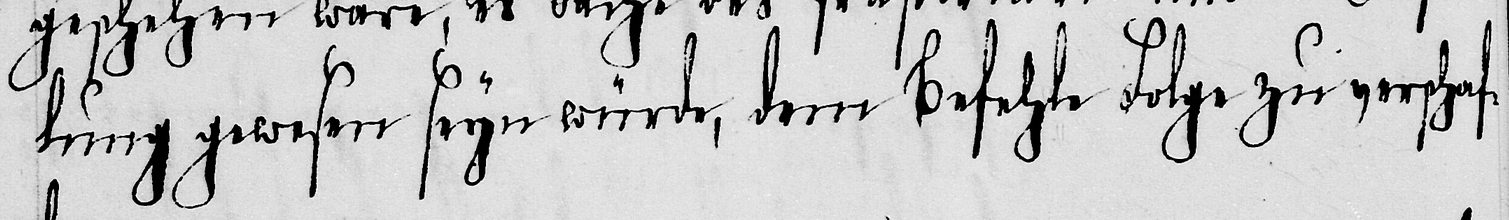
lung gewesen seyn würde, dem Befehle Folge zu versch¬
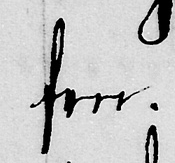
fen.
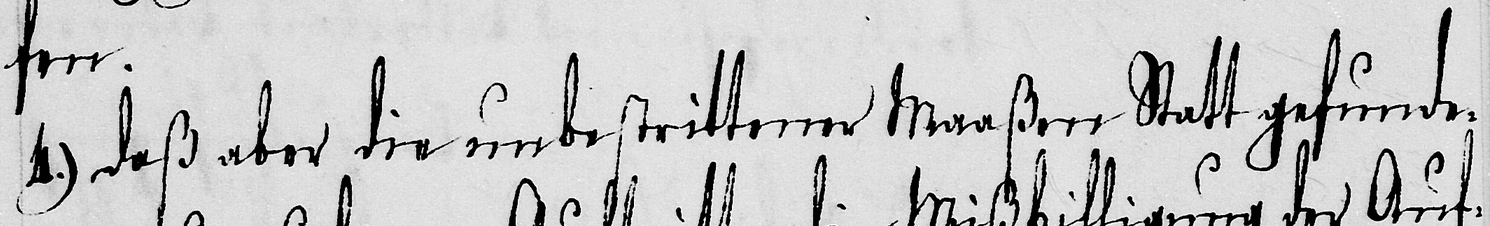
4.) daß aber die unbestrittener Maaßen Statt gefunde¬
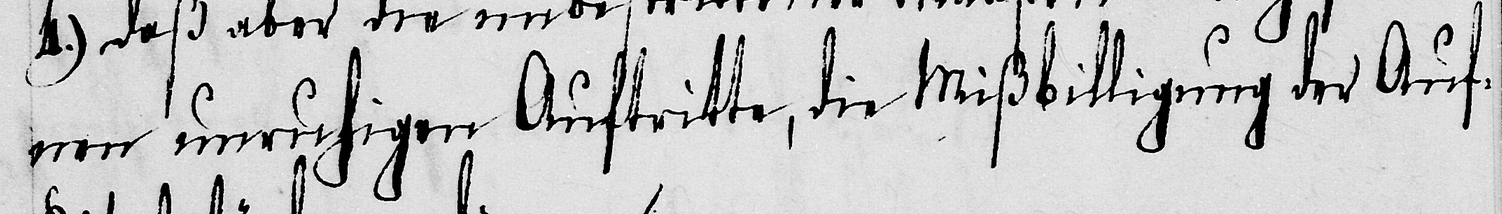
nen unruhigen Auftritte, die Mißbilligung der Auf¬
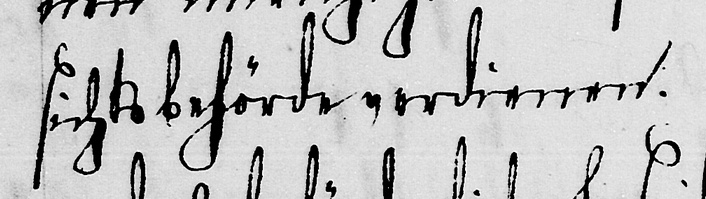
sichtsbehörde verdienen.
